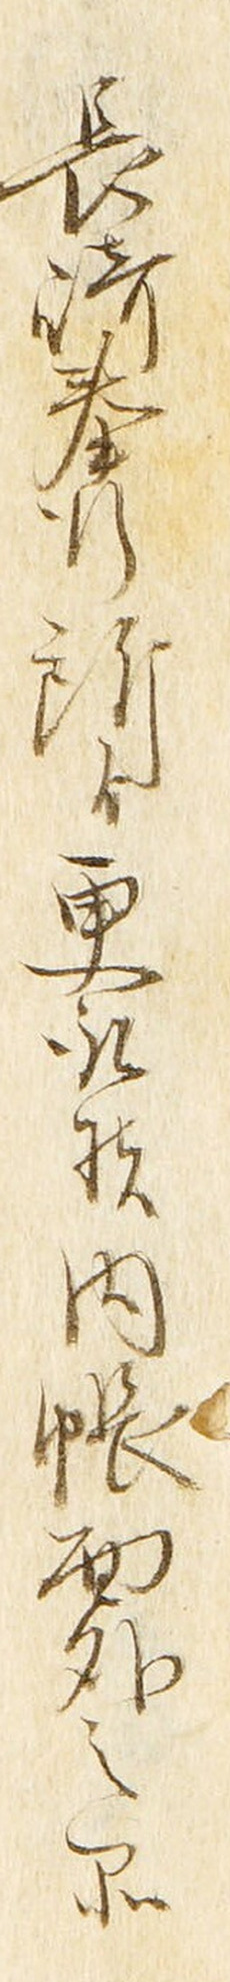長崎奉行所ゟ更取候内帳面外之品
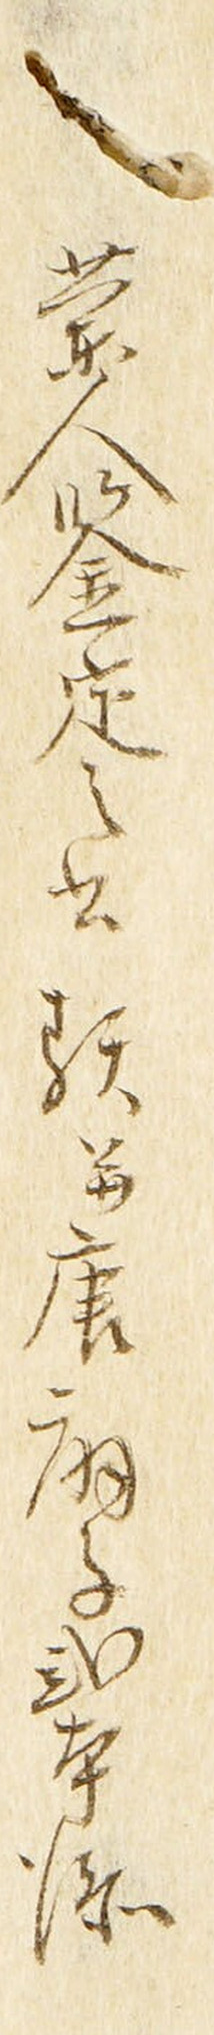？人銎定之書類並唐扇子弐本添

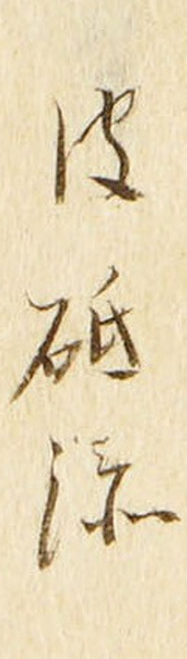皮砥添
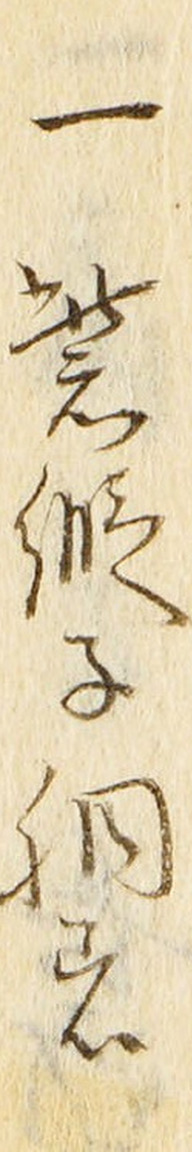一砦緞子胴着壱
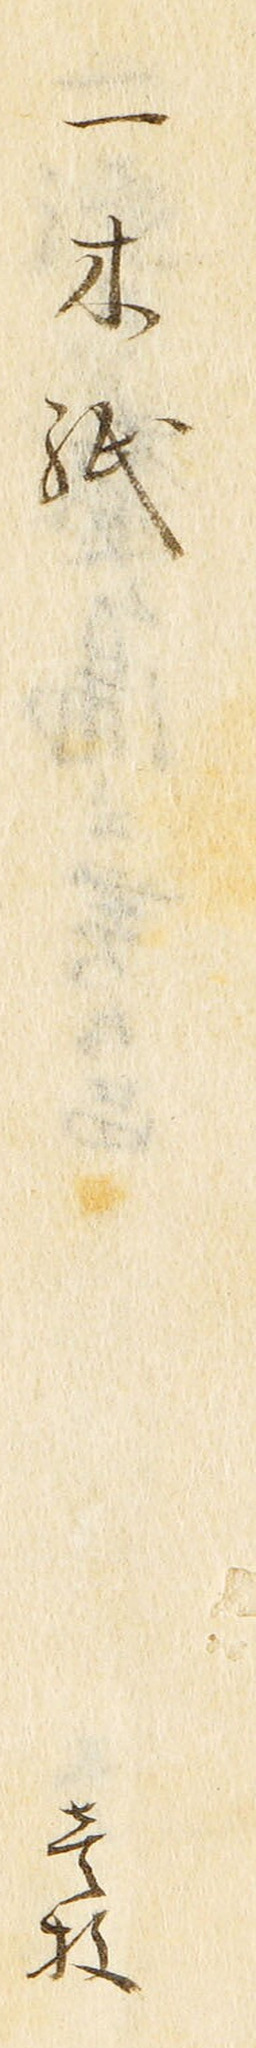一木紙壱枚
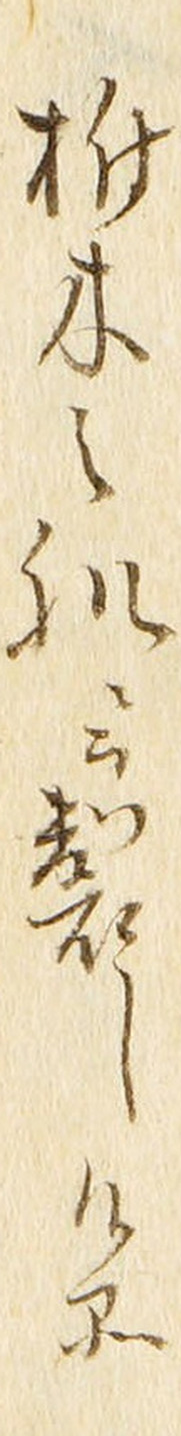椎木之肌に而製し候品
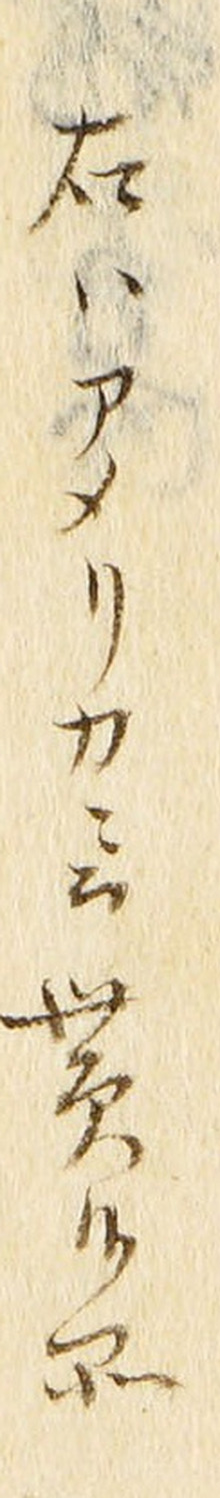右はアメリカに而貰候品
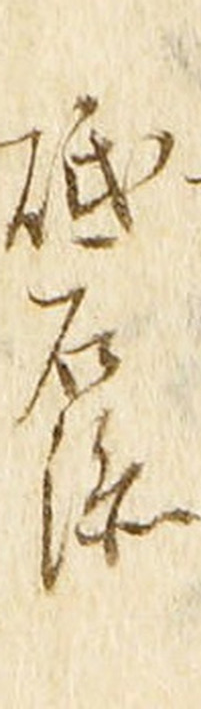砥石添
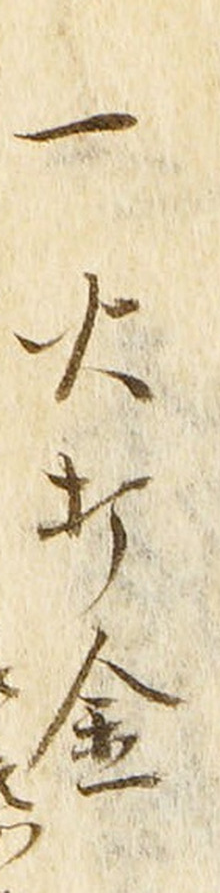一火打金弐
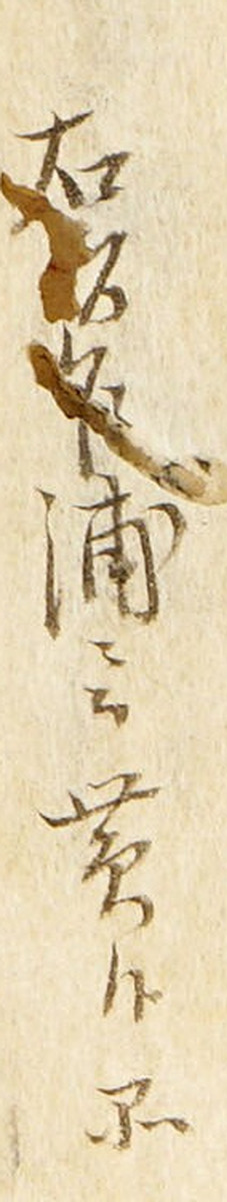右は乍浦に而貰候品
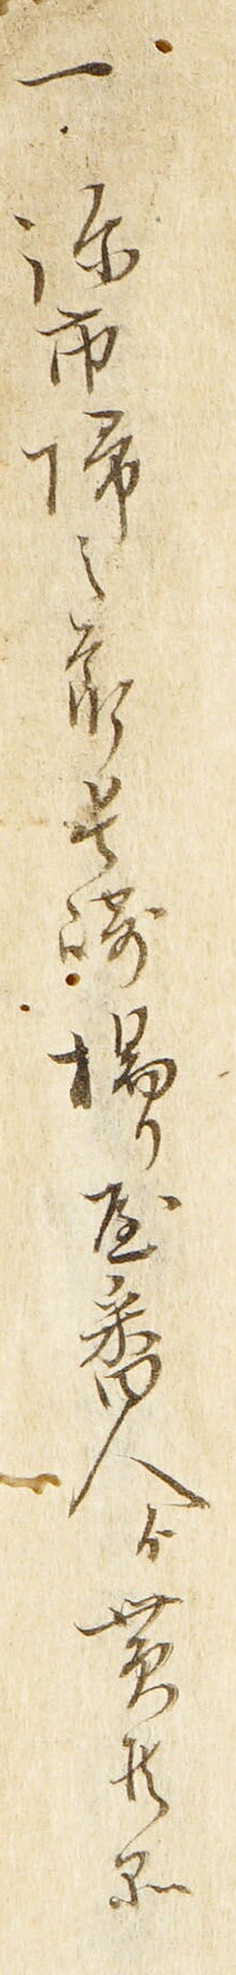一弥市帰之節長崎揚り屋番人ゟ貰候品

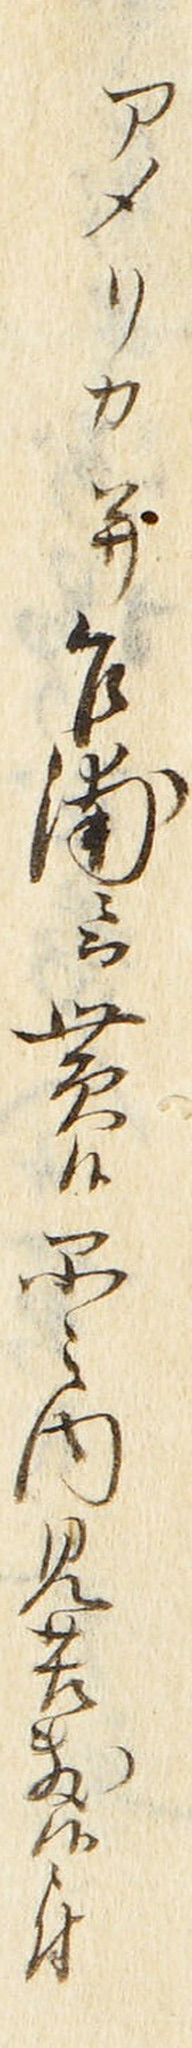アメリカ並乍浦に而貰候品之内見苦敷候に付
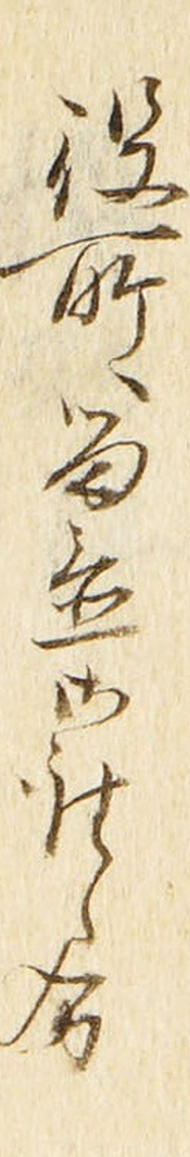役所へ留置御座候分
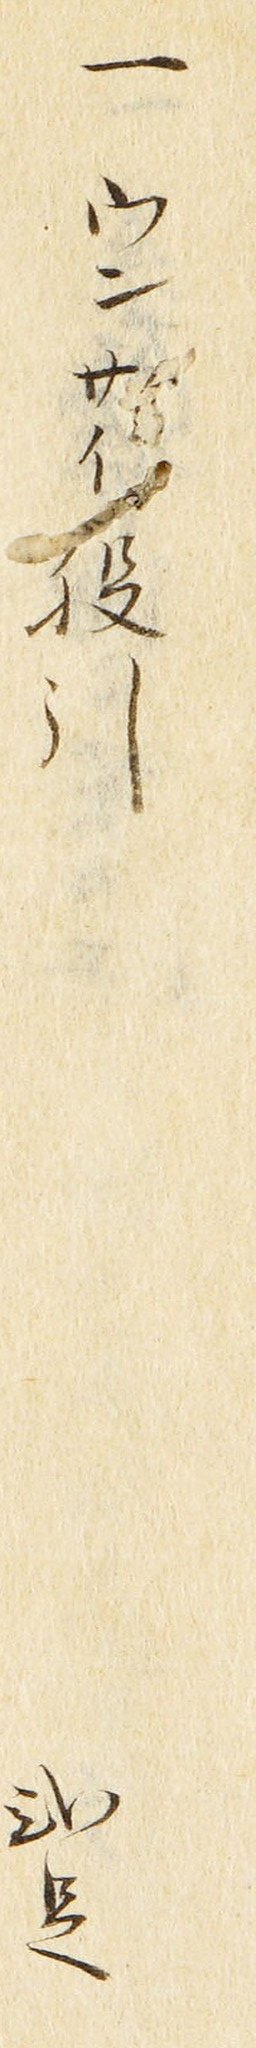一ウンサイ股引弐足
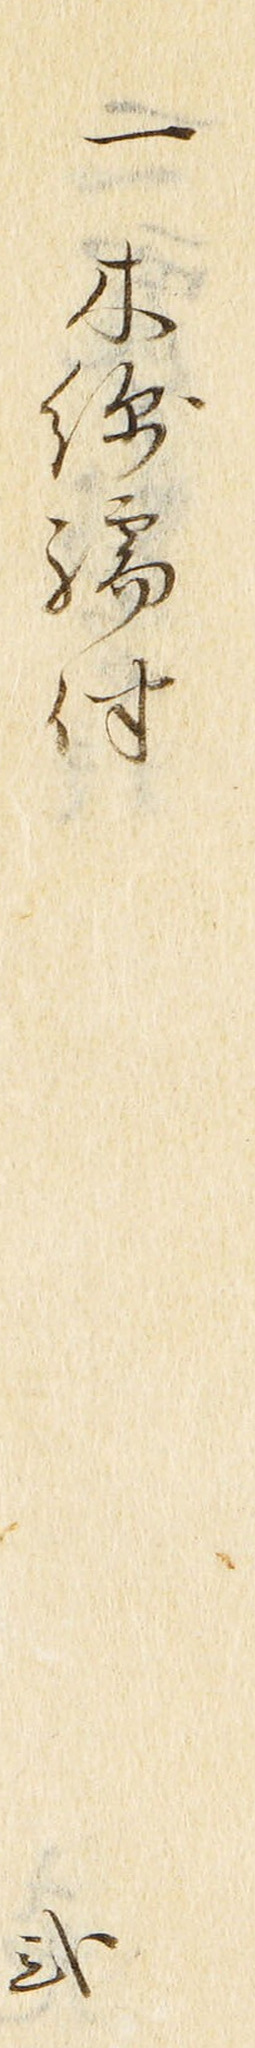一木綿襦伴弐
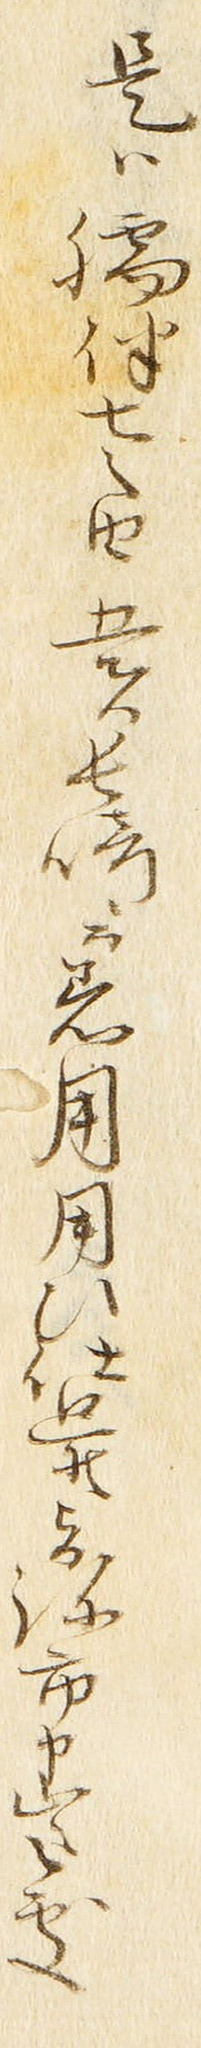是は襦伴七之内五は長崎に而着用用ひ仕廻候旨弥市申出候處
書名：長崎漂流記
